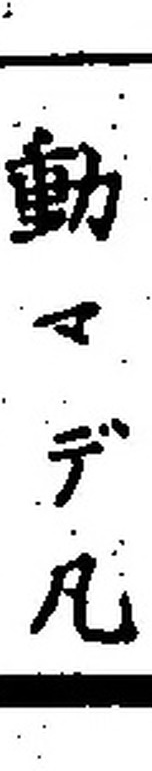動マデ凡
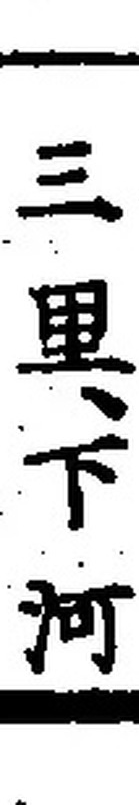三里、下河
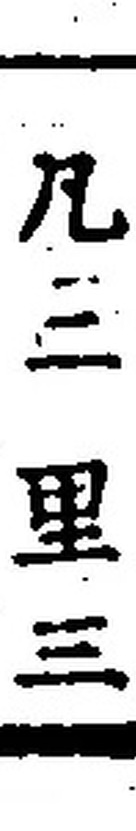凡二里三
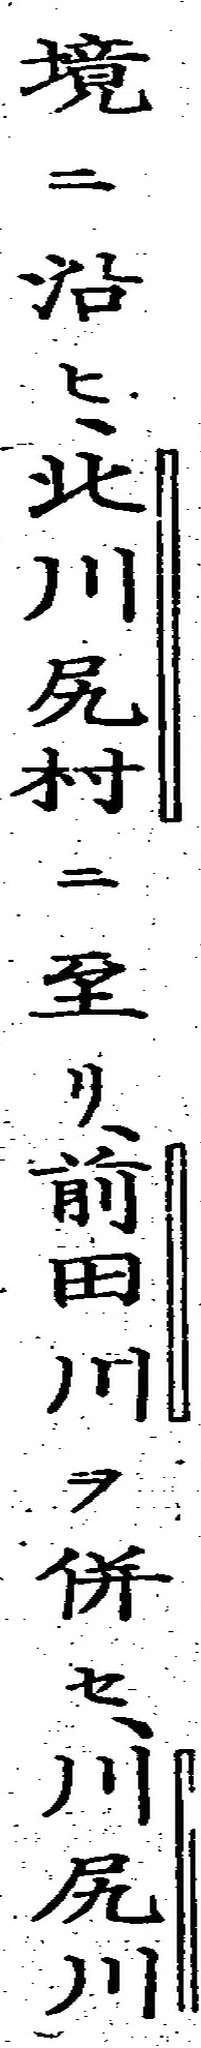境ニ沿ヒ、北川尻村ニ至リ、前田川ヲ併セ、川尻川
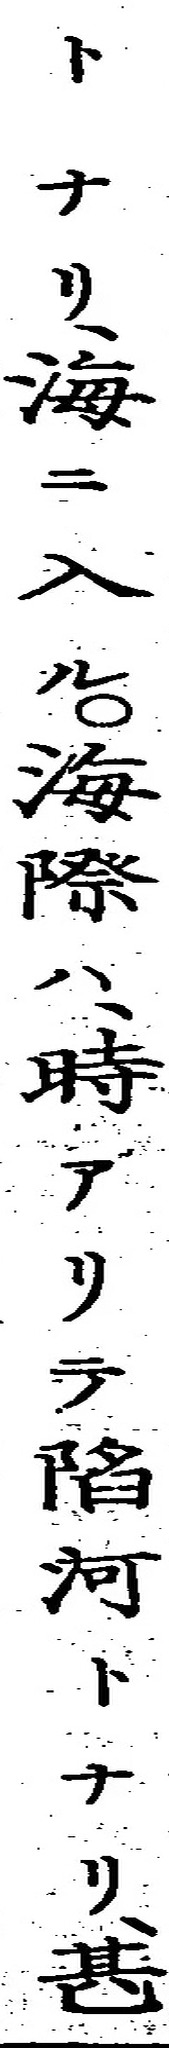トナリ、海ニ入ル。海際ハ、時アリテ陥河トナリ、甚

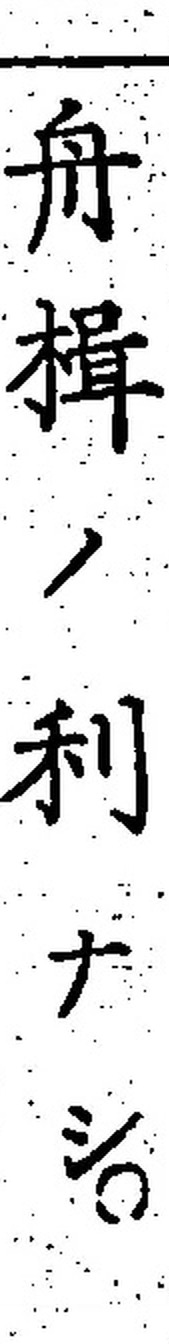舟楫ノ利ナシ。
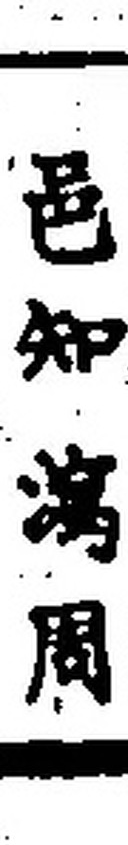邑知瀉周
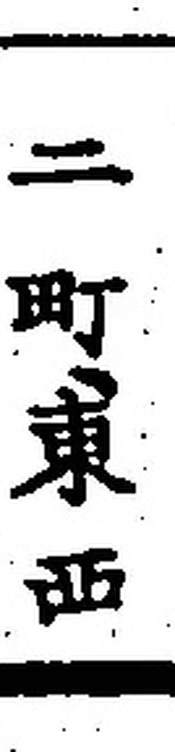二町、東西
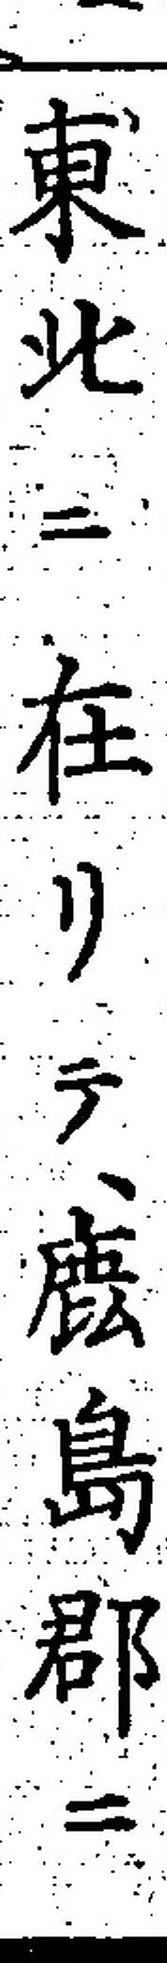東北ニ在リテ、鹿島郡ニ
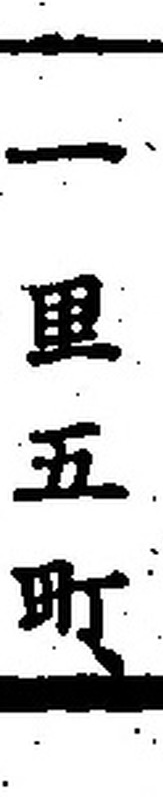一里五町、
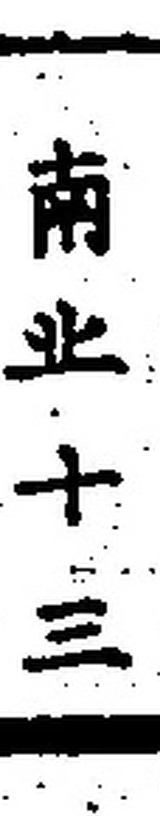南北十三
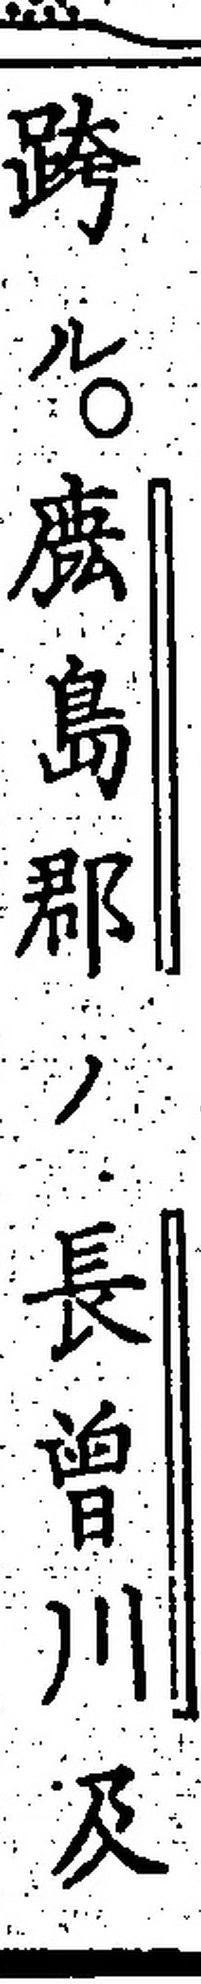跨ル。鹿島郡ノ長曽川及
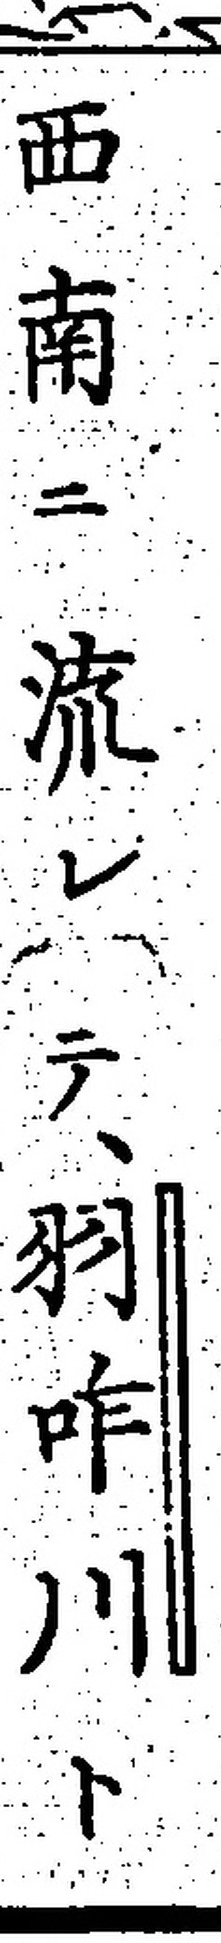西南ニ流レテ、羽咋川ト
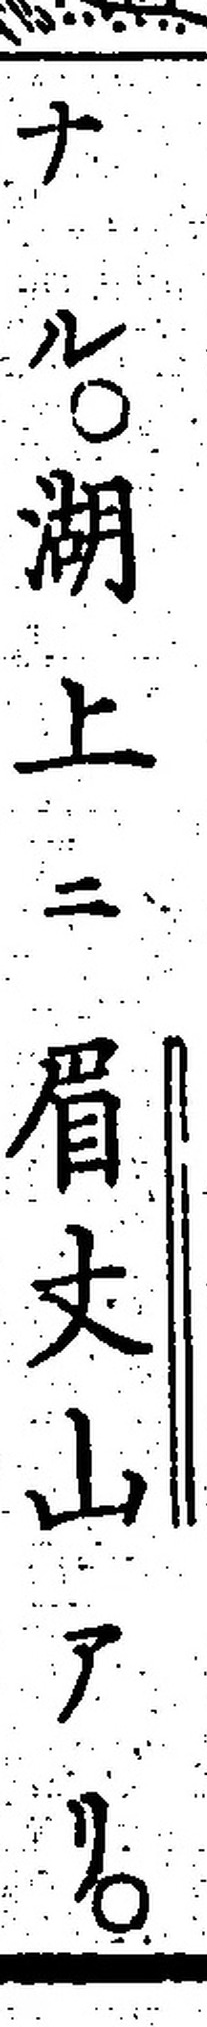ナル。湖上ニ眉丈山アリ。
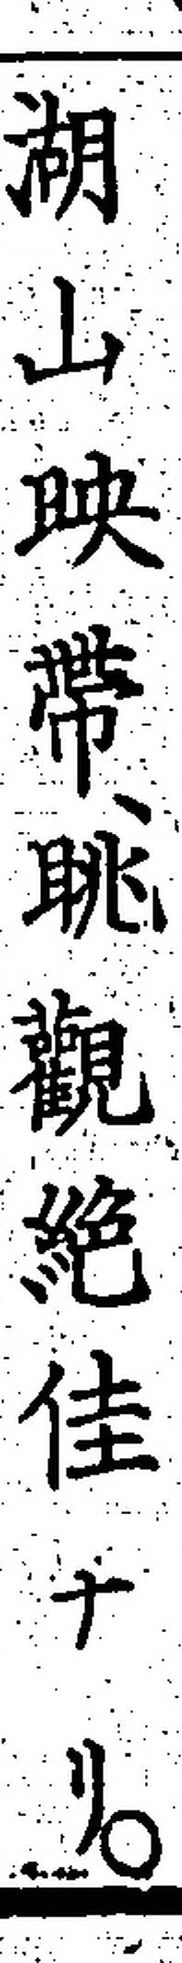湖山映帯、眺観絶佳ナリ。
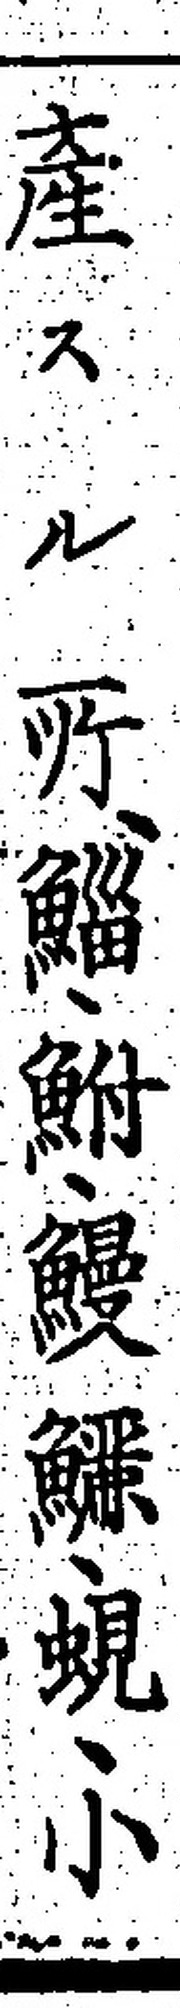産スル所、鯔・鮒・鰻鱺・蜆・小
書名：能登地誌略
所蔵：国立国会図書館 National Diet Library, JAPAN
